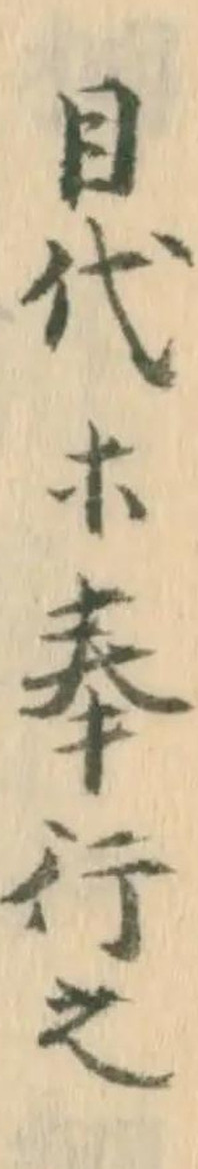目代等奉行之
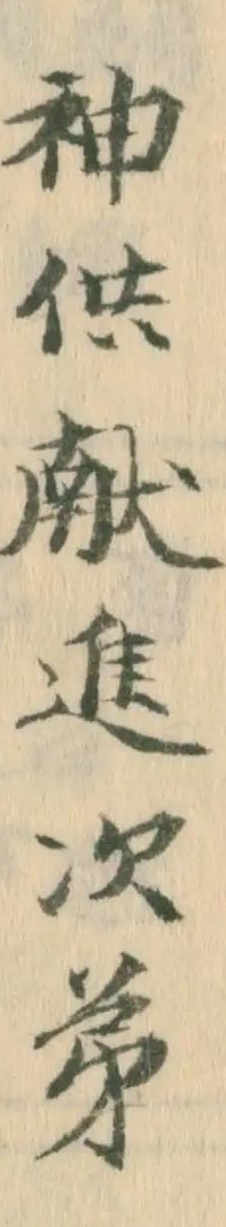神供献進次第
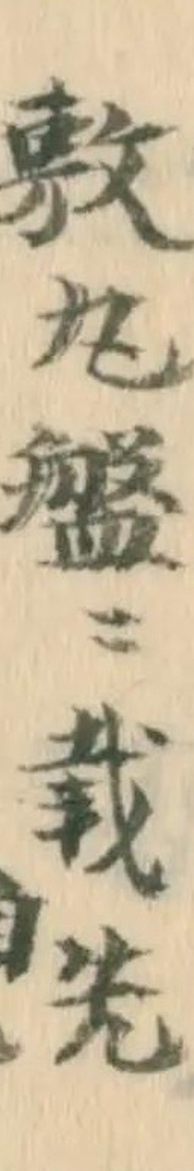敷丸盤ニ載先
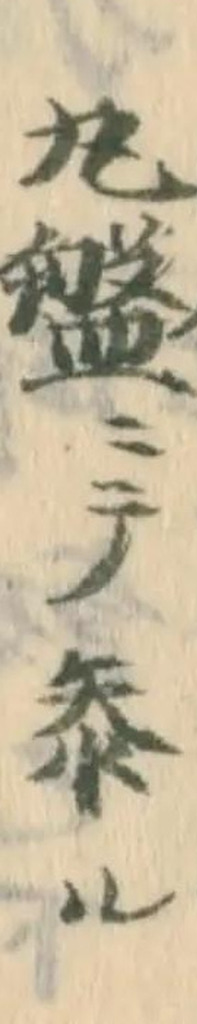九盤ニテ参ル

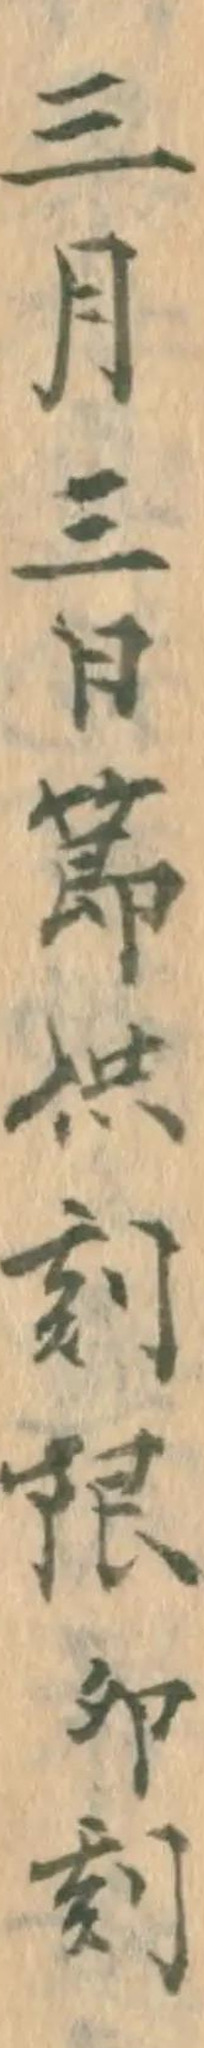三月三日節供刻限卯刻
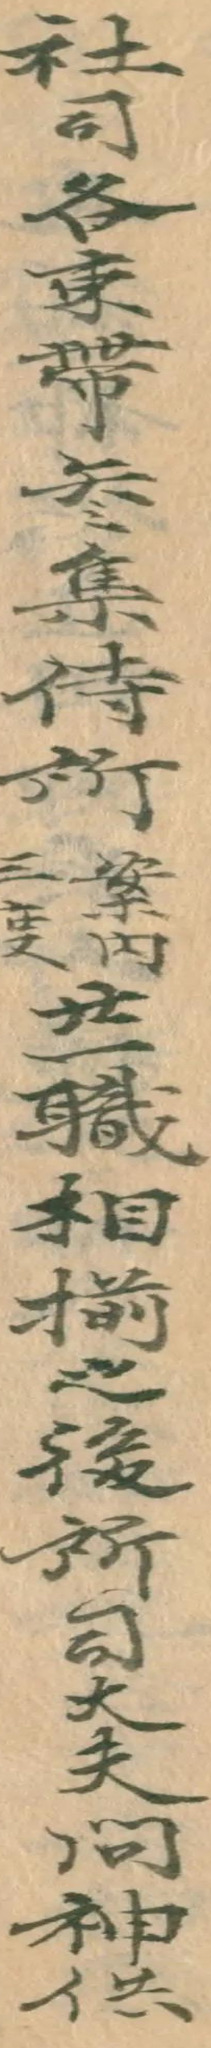社司各束帯参集侍所案内三度廿一職相揃之後所司大夫問神供
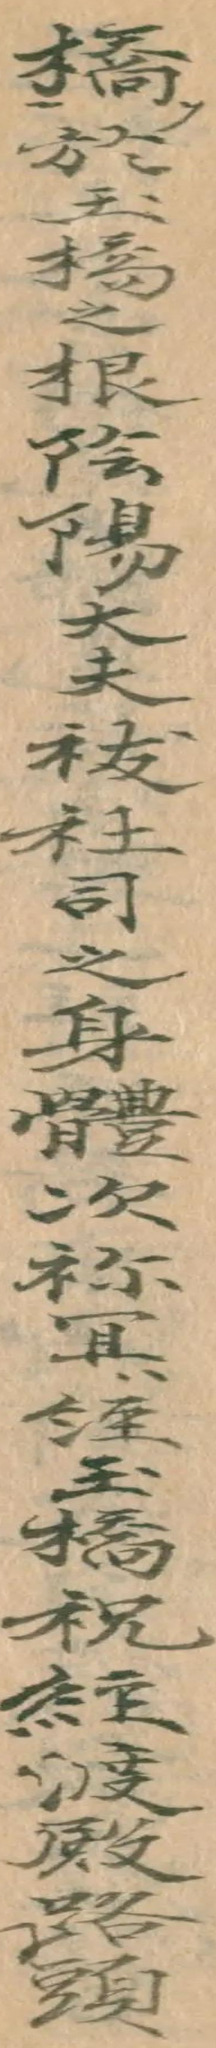橋於玉橋之根陰陽大夫秡社司之身体次禰宜玉橋祝経渡殿路頭
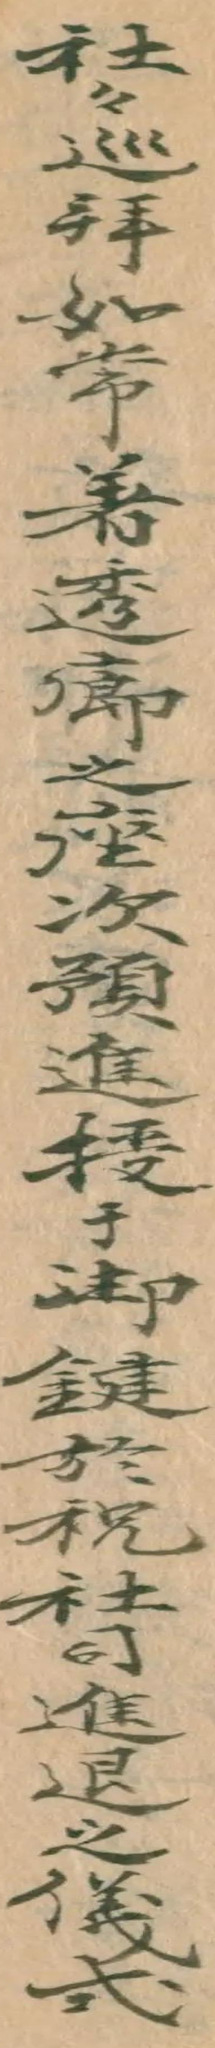社々巡拝如常着透廊之座次預進授于御鍵於祝社司進退之儀式
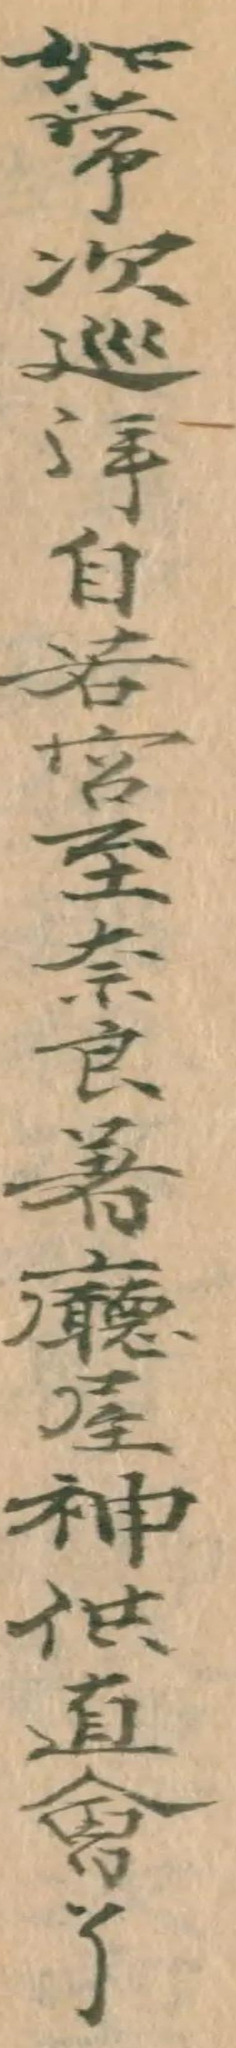如常次巡拝自若宮至奈良着庁屋神供直会了
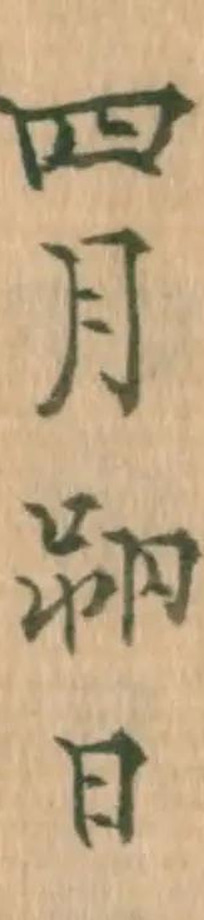四月朔日
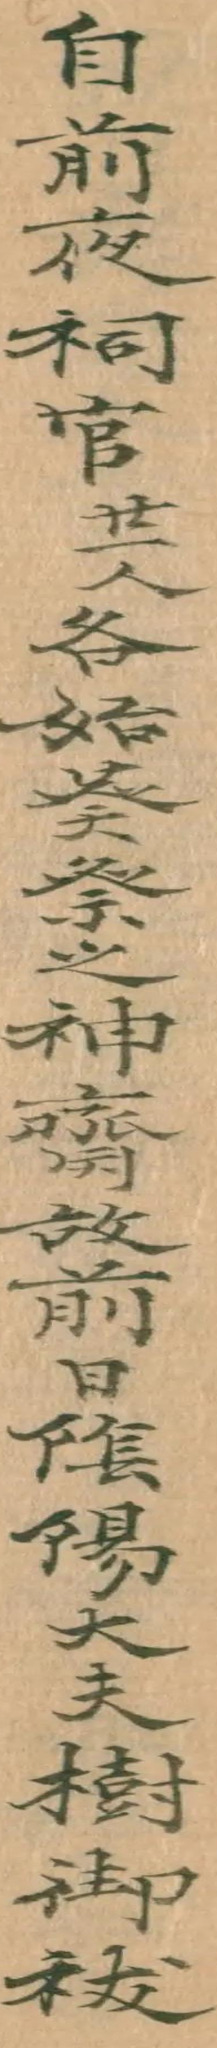自前夜祠官廿一人各始葵祭之神斎故前日陰陽大夫樹御祓
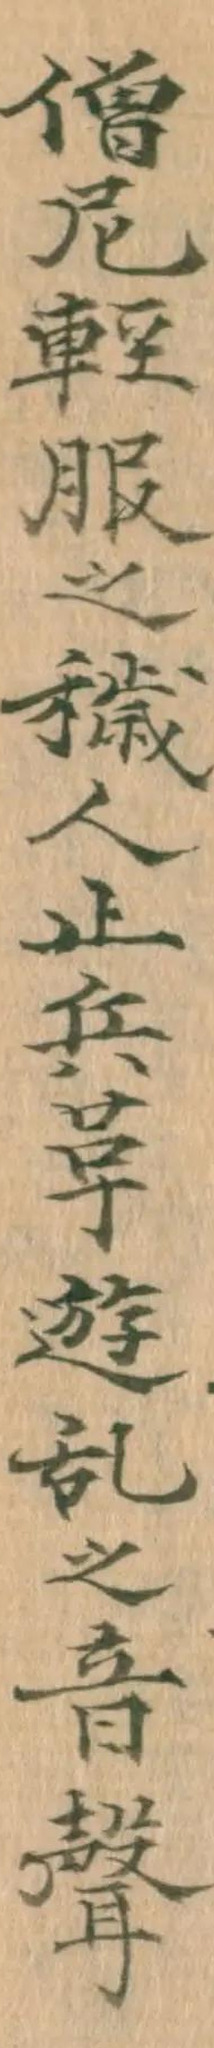僧尼軽服之穢人止兵革遊乱之音声
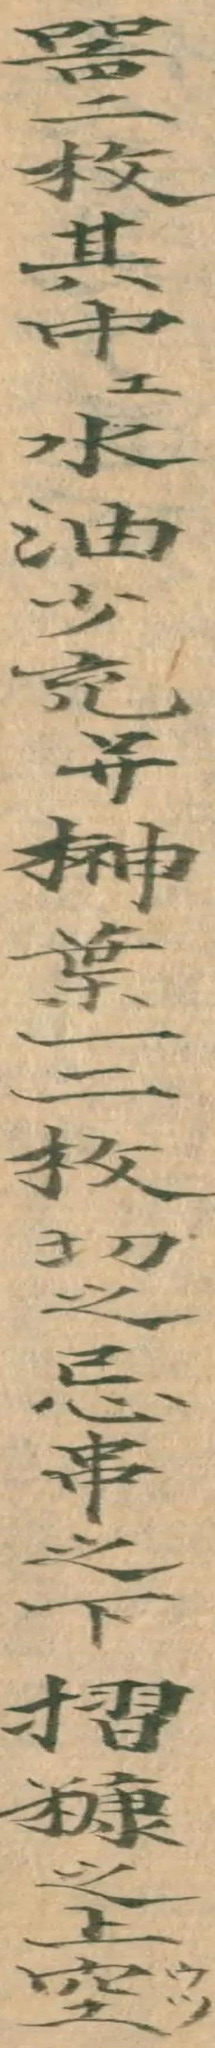器二枚其中エ水油少充并榊葉一二枚切之忌串之下摺糠之上空

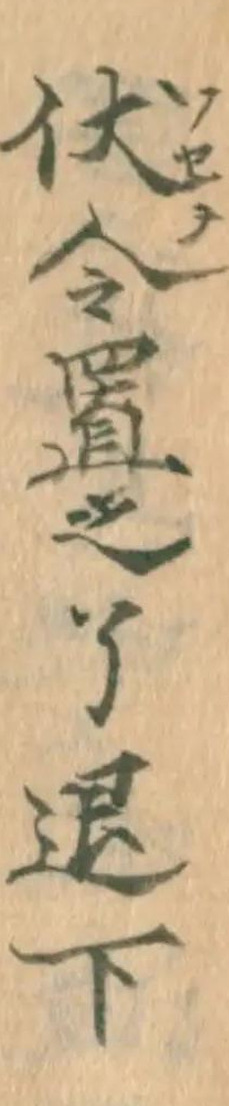伏令置之了退下
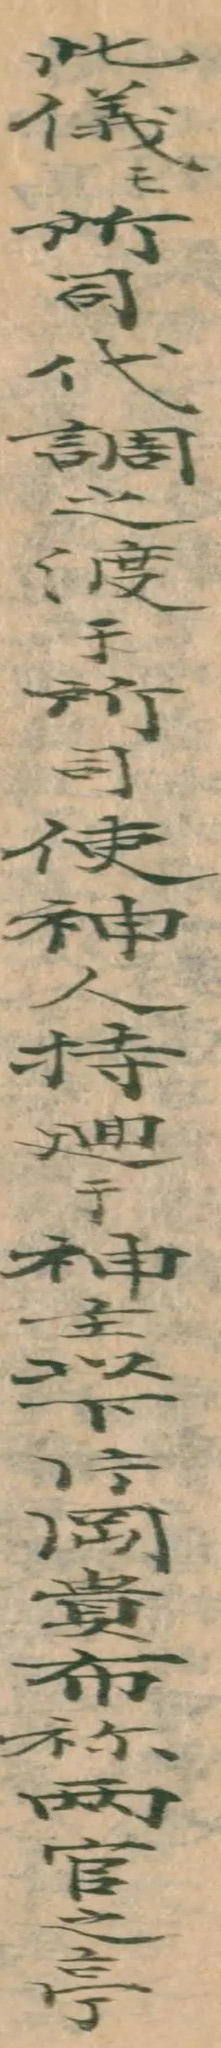此儀モ所司代調之渡于所司使神人持廻于神主以下片岡貴布禰両官之亭

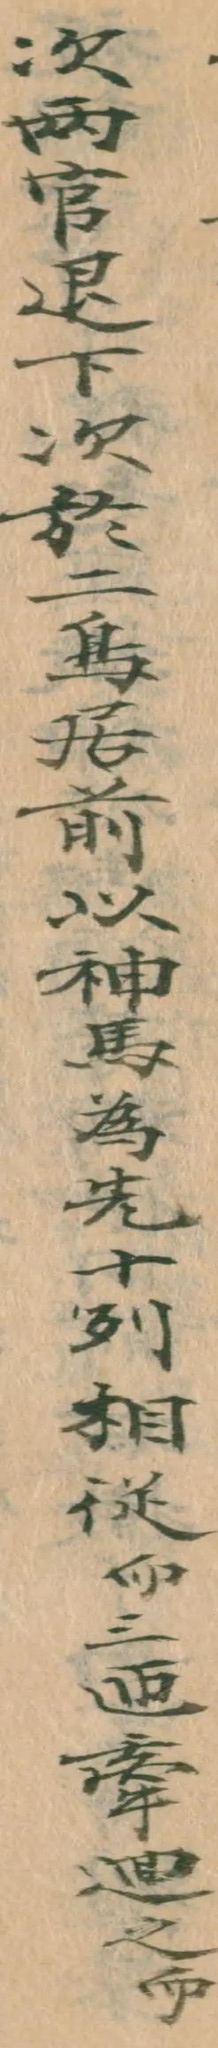次両官退下次於二鳥居前以神馬為先十列相従而三匝牽廻之而
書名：賀茂社記録. 第5冊
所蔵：国立国会図書館 National Diet Library, JAPAN
